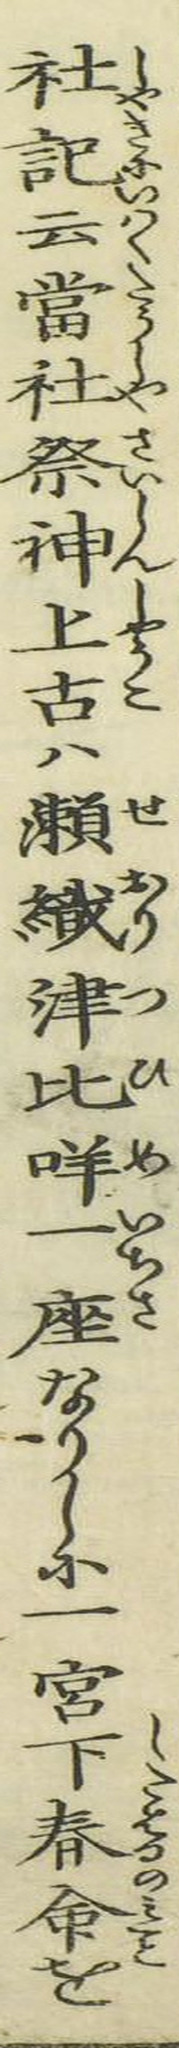社記云当社祭神上古は瀬織津比咩一座なりしに一宮下春命を
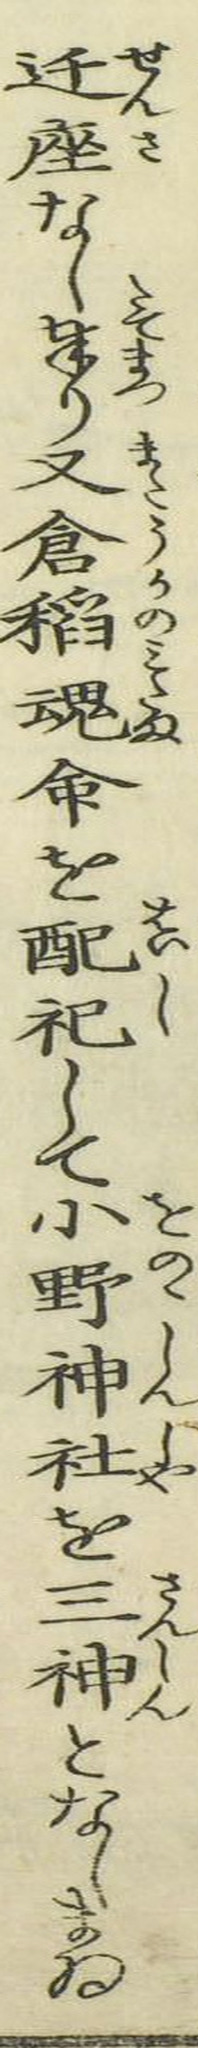遷座なし奉り又倉稲魂命を配祀して小野神社を三神となしまゐ
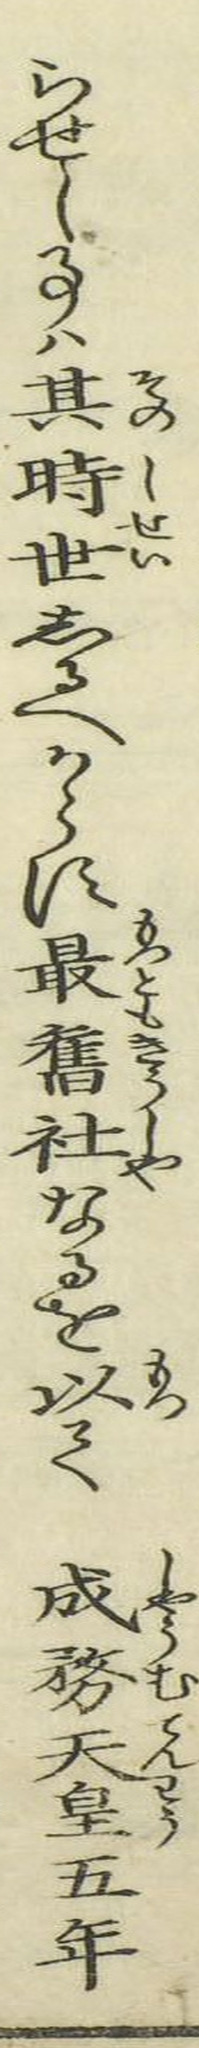らせし事は其時世しるへからす最舊社なるを以て成務天皇五年
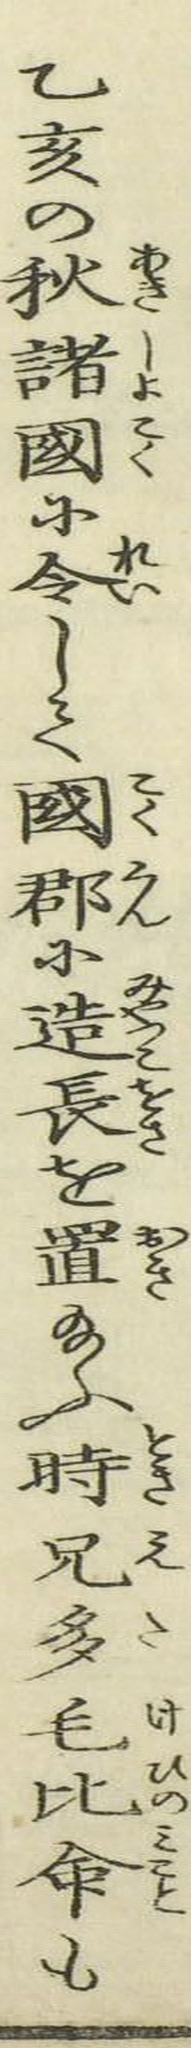乙亥の秋諸国に令して国郡に造長を置給ふ時兄多毛比命も
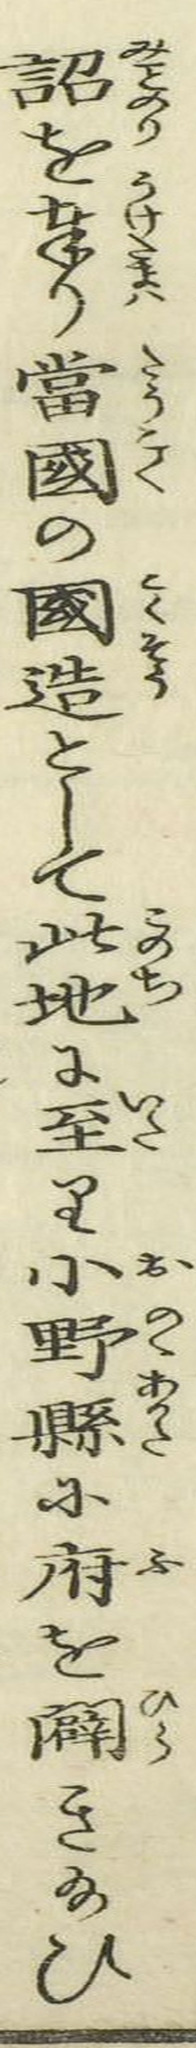詔を奉り当国の国造として此地に至り小野県に府を闢き給ひ
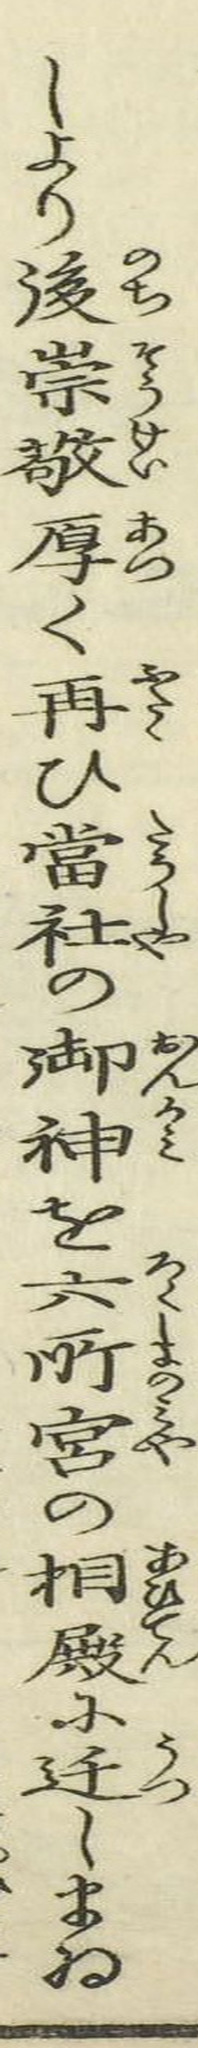しより後崇敬厚く再ひ当社の御神を六所宮の相殿に遷しまゐ
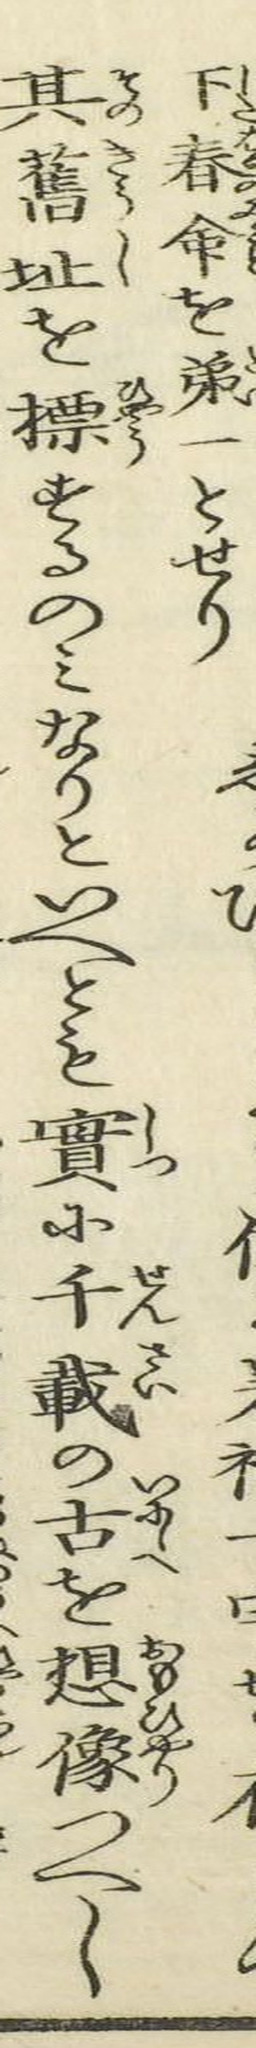其舊址を標するのみなりといへとも実に千載の古を想像つへし
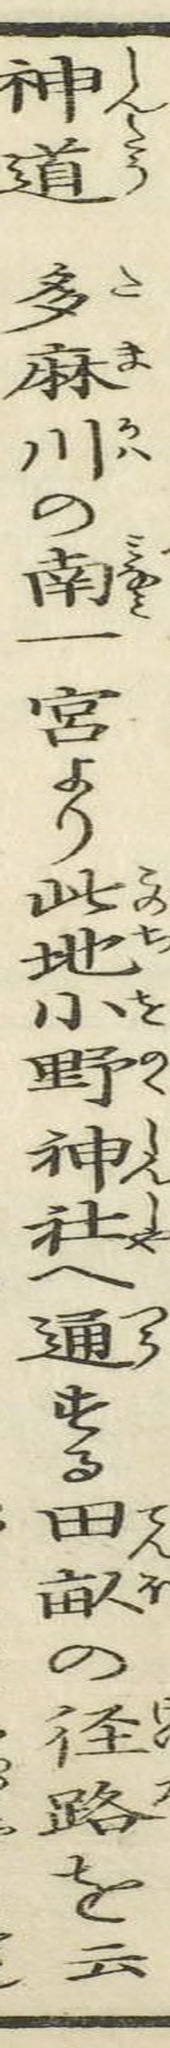神道多麻川の南一宮より此地小野神社へ通する田畒の径路を云
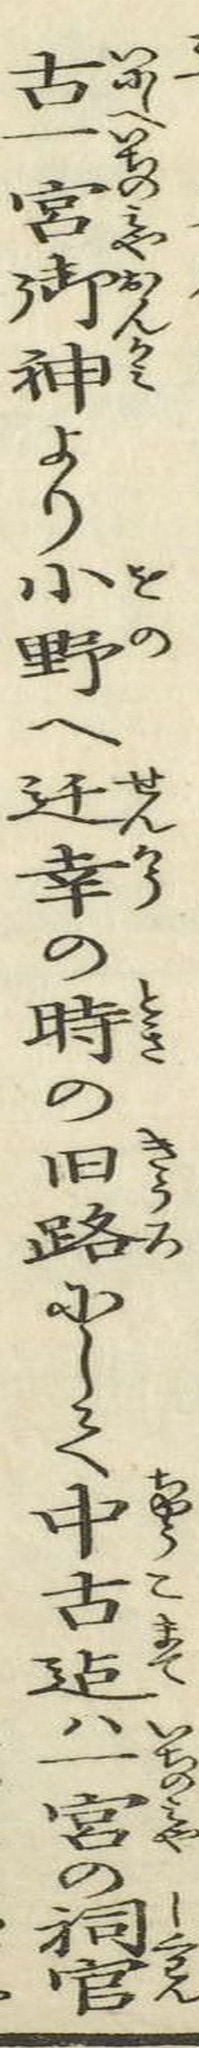古一宮御神より小野へ遷幸の時の旧路にして中古迠は一宮の祠官
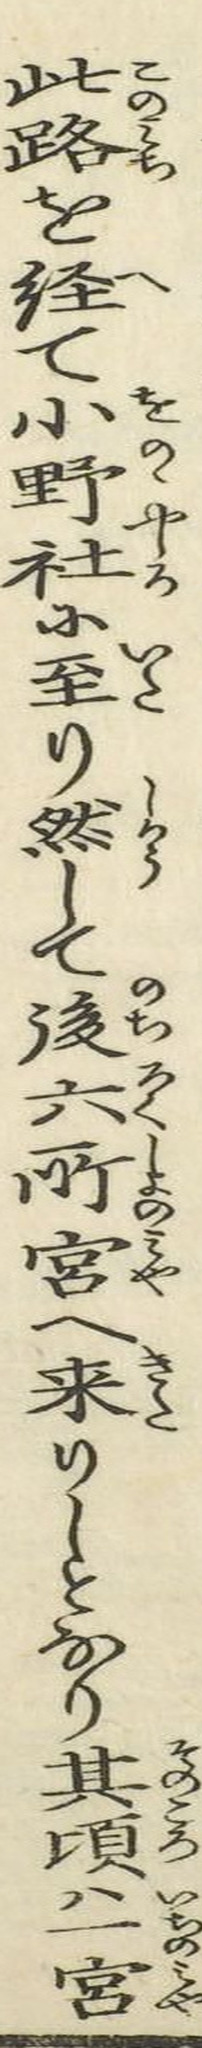此路を経て小野社に至り然して後六所宮へ来りしとなり其頃は一宮
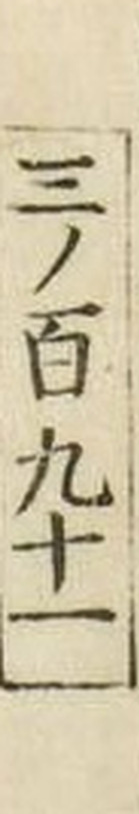三ノ百九十一
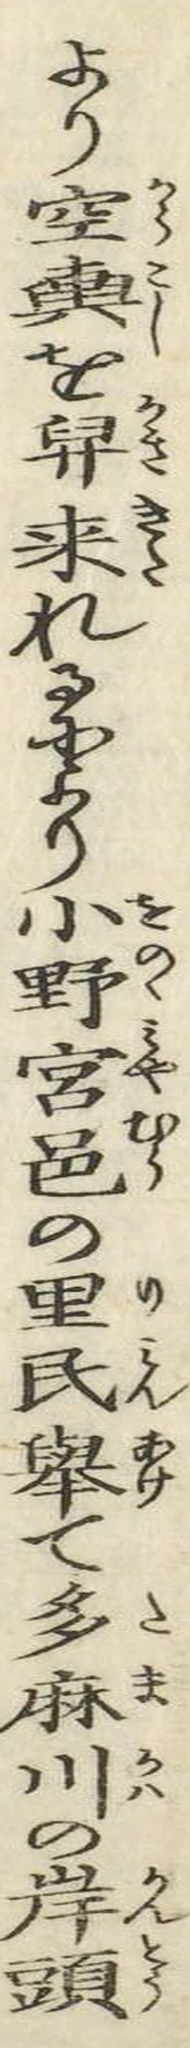より空輿を舁来れるにより小野宮邑の里民挙て多麻川の岸頭
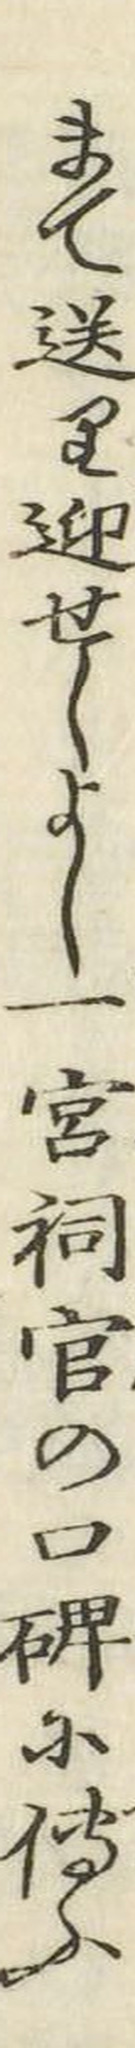まて送り迎せしよし一宮祠官の口碑に伝ふ
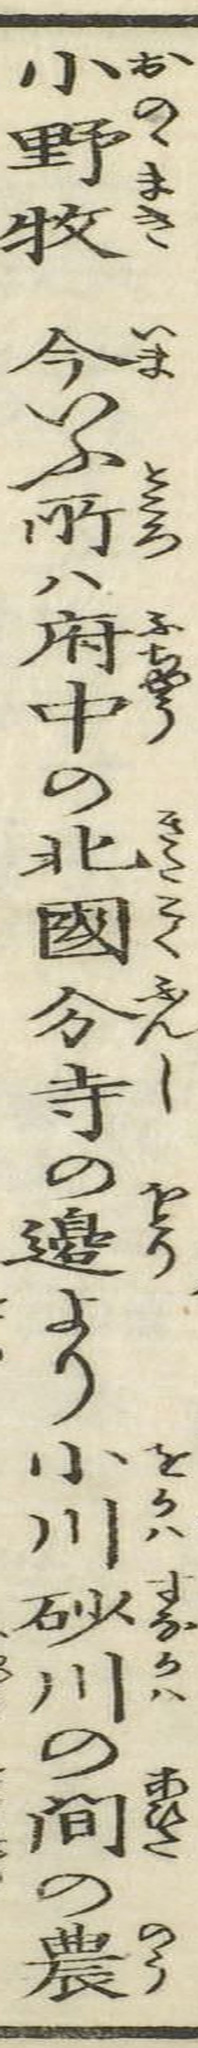小野牧今いふ所は府中の北国分寺の辺より小川砂川の間の農
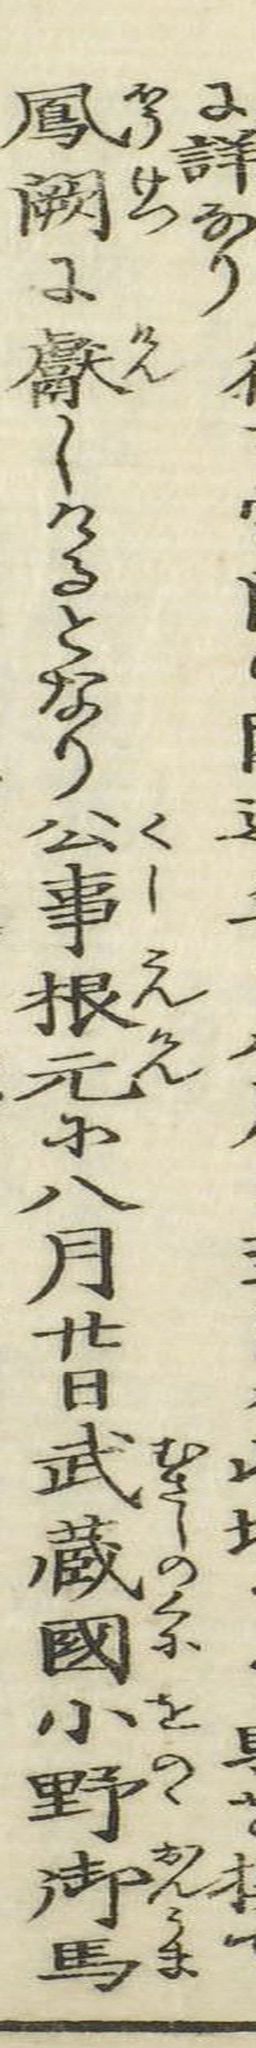鳳闕に獻しけるとなり公事根元に八月廿日武蔵国小野御馬
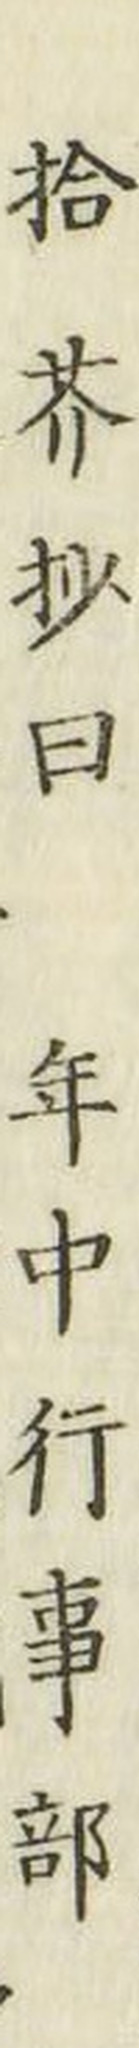拾芥抄曰年中行事部
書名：江戸名所図会 20巻 巻之10
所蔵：東京学芸大学教育コンテンツアーカイブ
